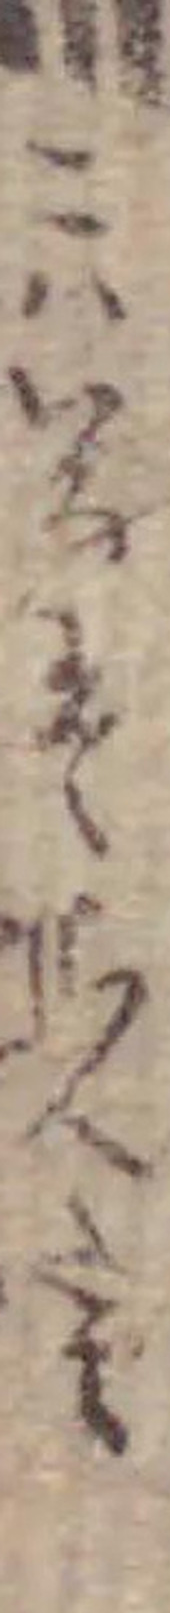こはいろにてちんたみ
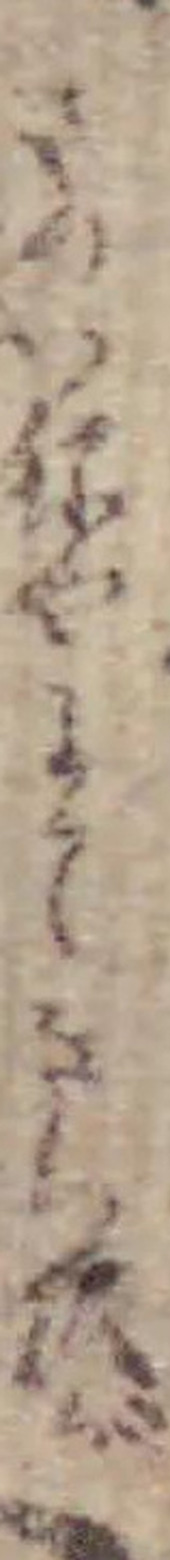きのいねやにてきち次が
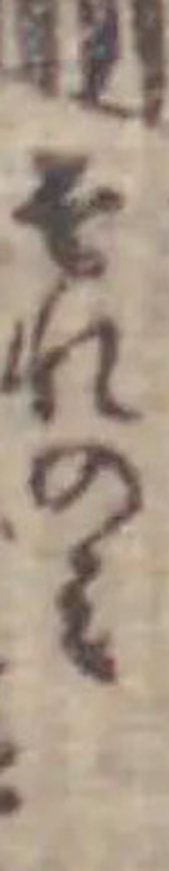それのみ
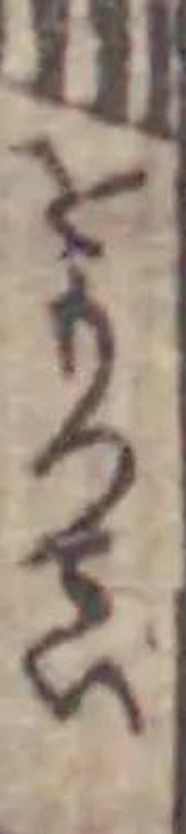をもつてい
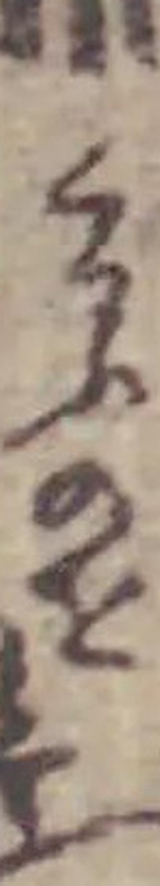くるふのをみて
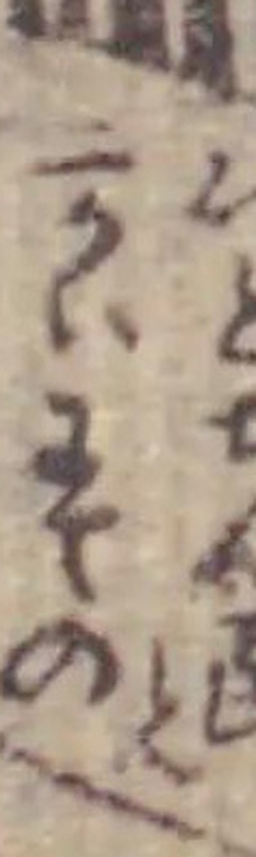二かいにての
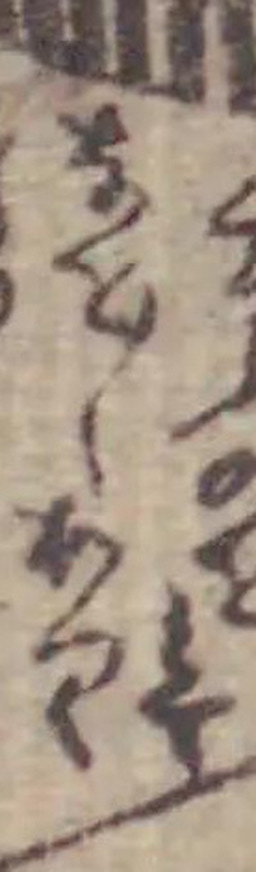なを〳〵あつく
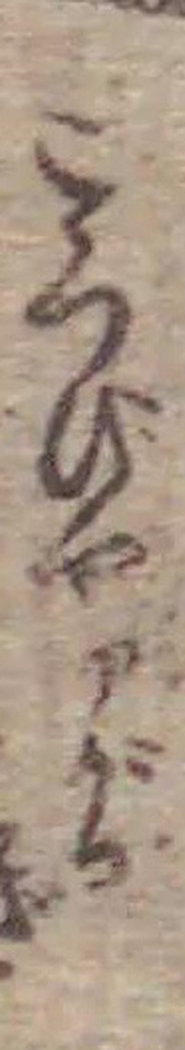ころびやァがる
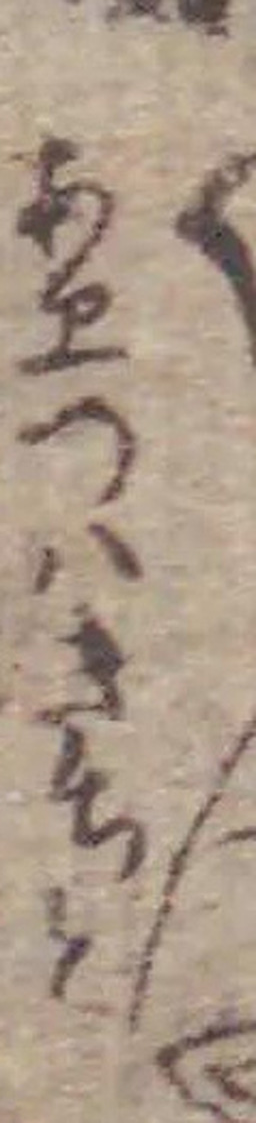あヱつはきちと

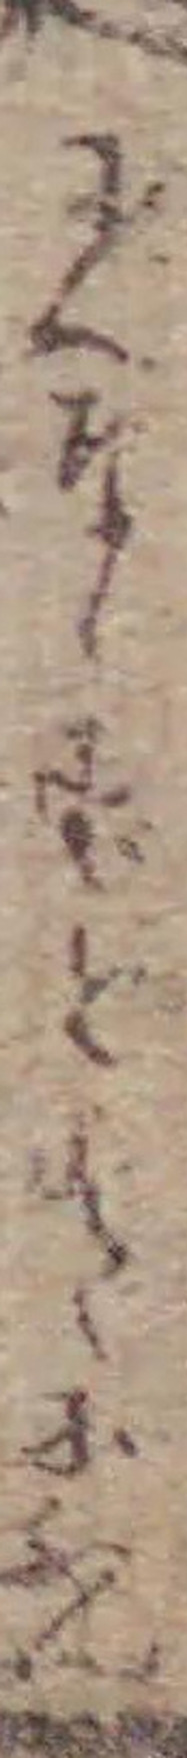にんならずとすくにふん
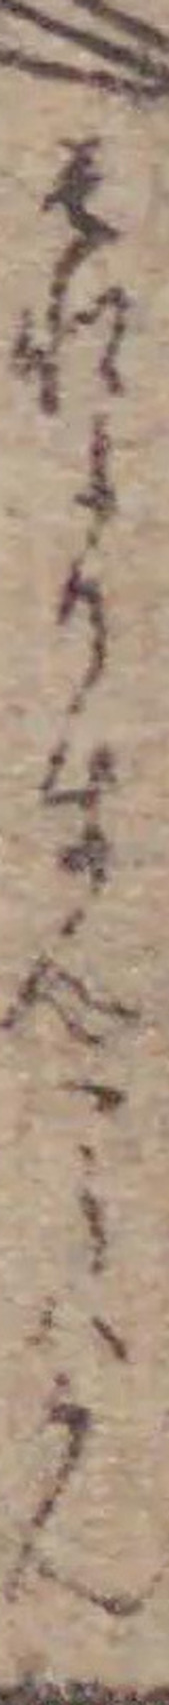それよりまんこうはかん
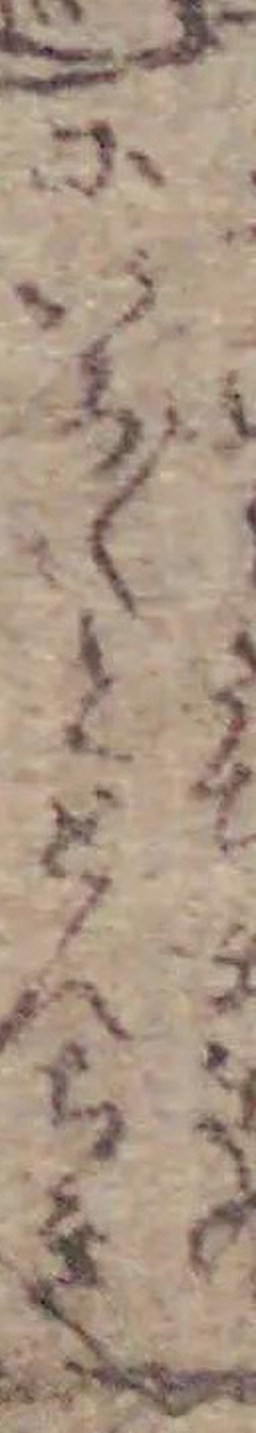にいろ〳〵ととんちき
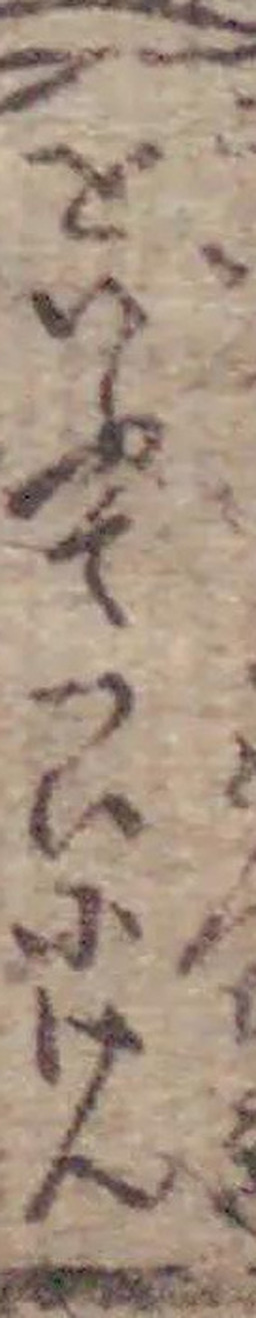をいふてついにけん
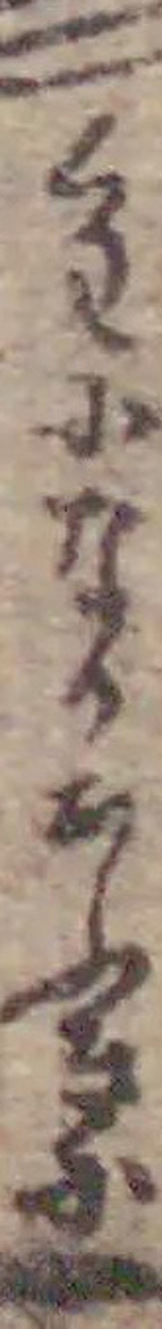くわになりおふきに
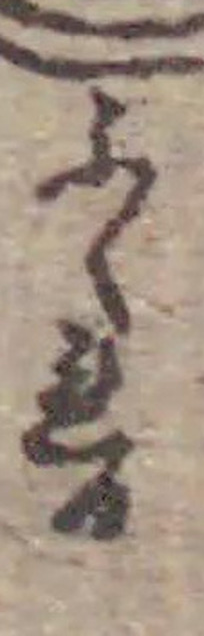ふくれる
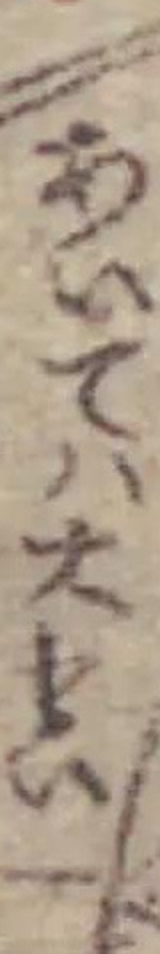あいては大せい
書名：通人為真似 2巻
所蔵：国立国会図書館 National Diet Library, JAPAN
